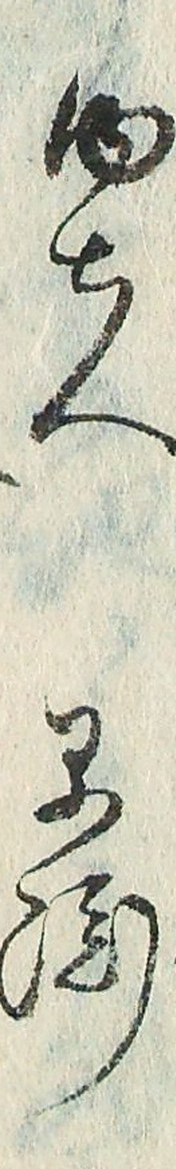内七人早淵
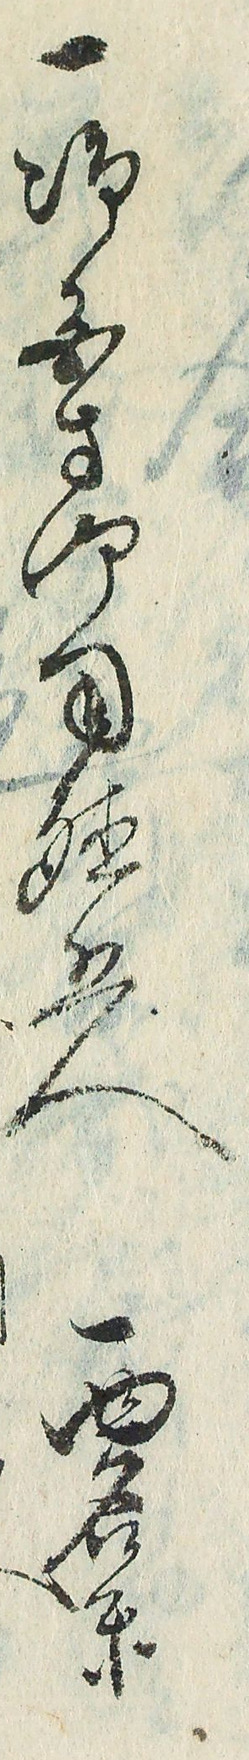一御国方御用聴五人西名東
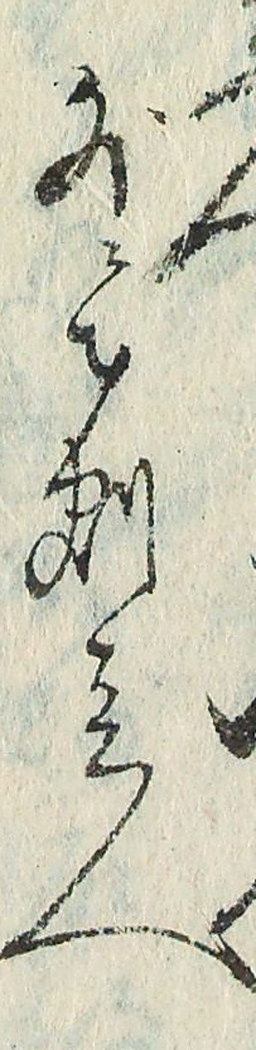外に才判壱人
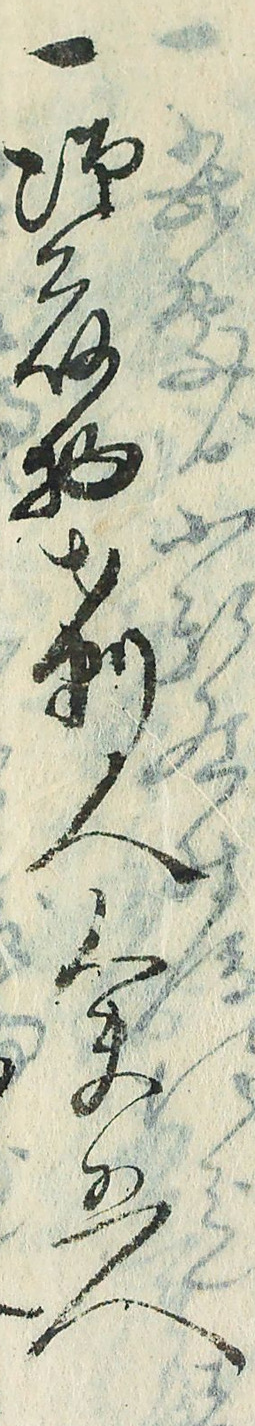一御荷物才判人人夫五人
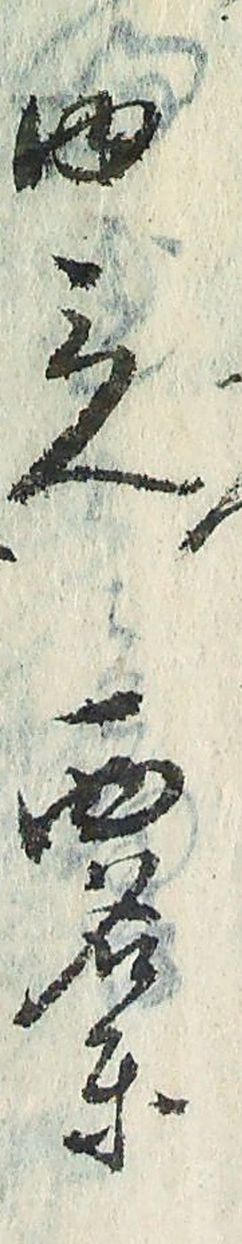内三人西名東
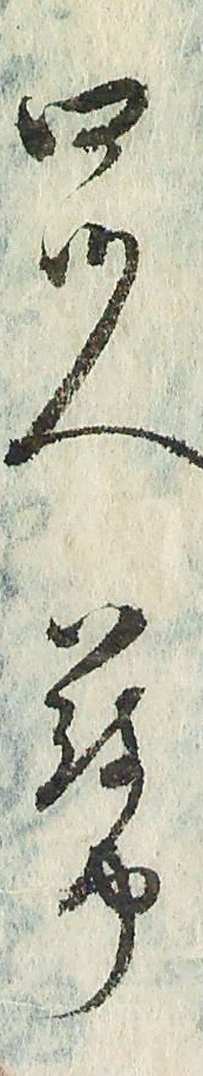同弐人府中
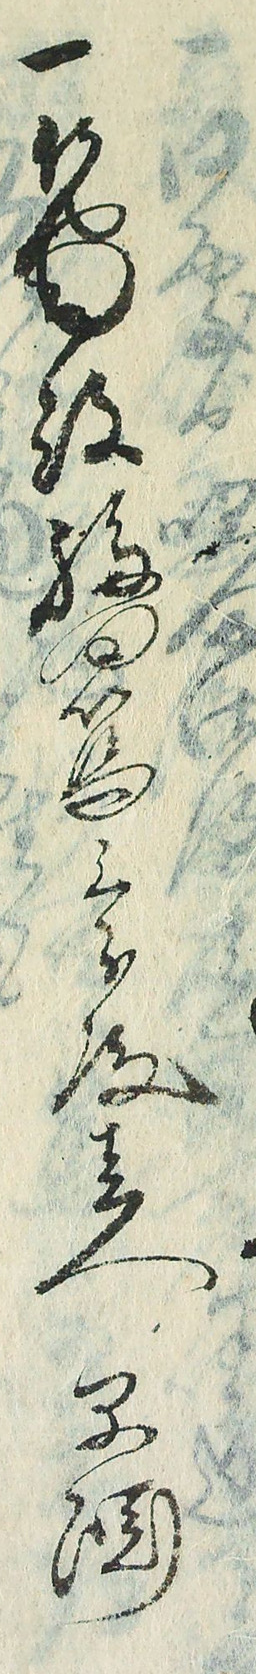一御筆役福田篤三郎殿壱人早淵
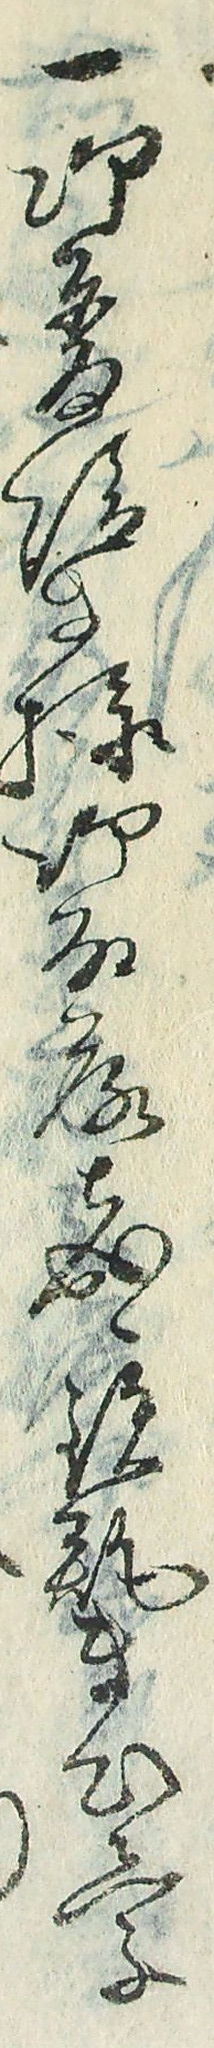一御普請方様御取落被成候鉄瓶専心気
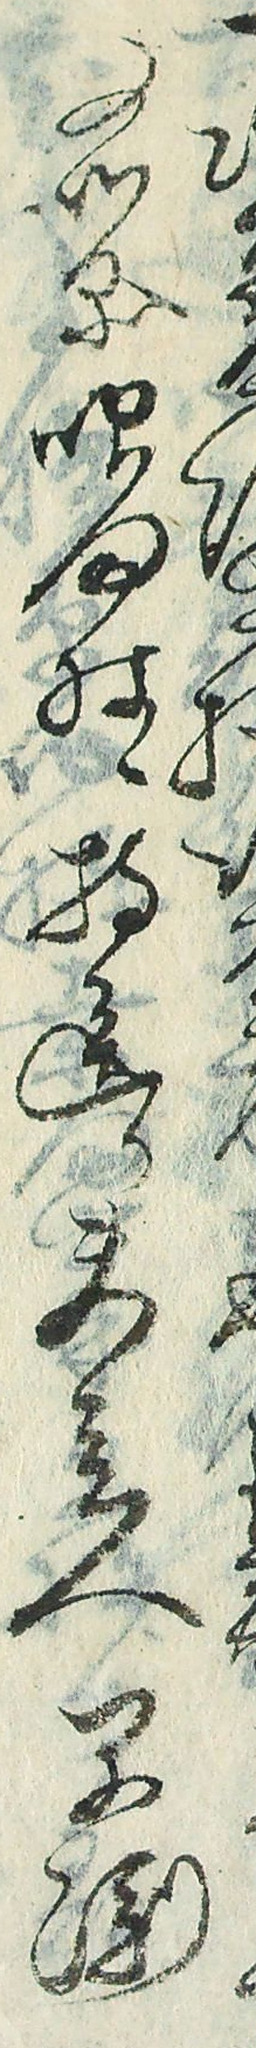〆弐品吹田村へ持送り夫壱人早淵

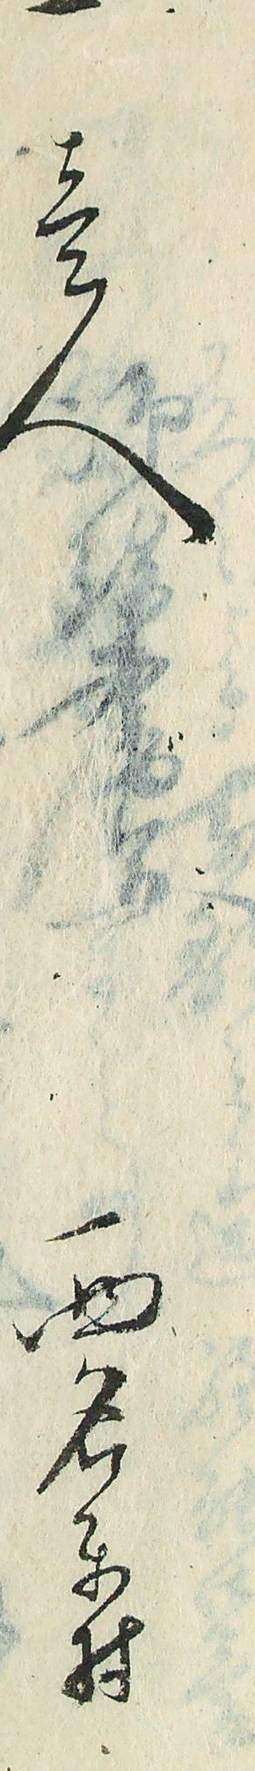一壱人西名東村
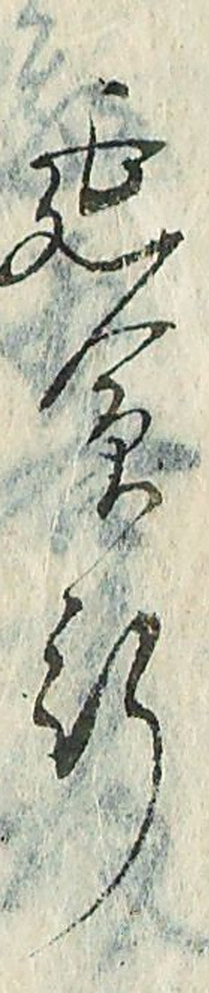延命行
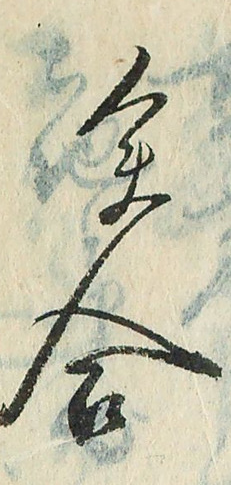人夫合
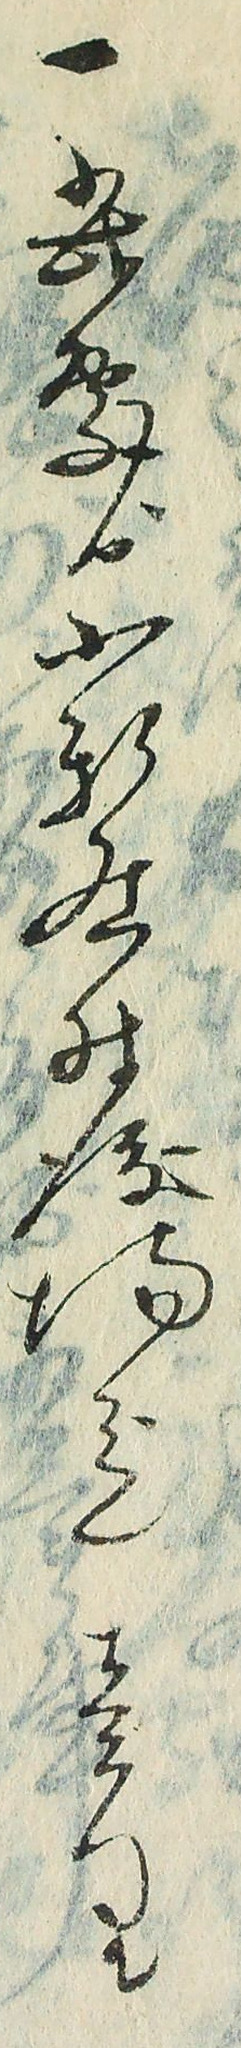一当処ゟ北新居村渡場迄壱里
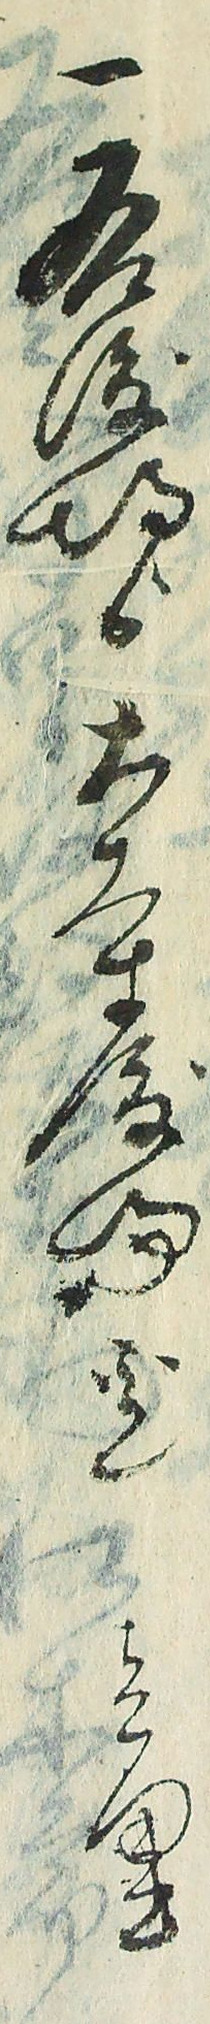一右渡場ゟ大寺渡場迄壱里
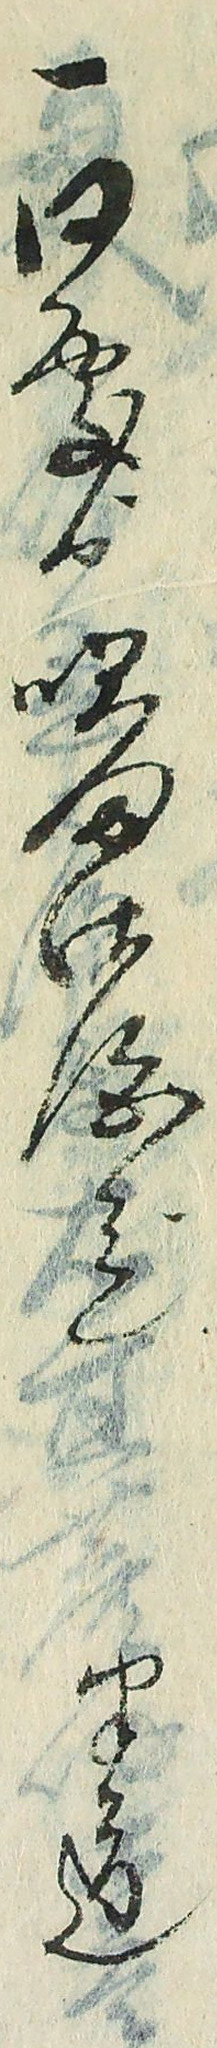一同処ゟ吹田御泊迄半道
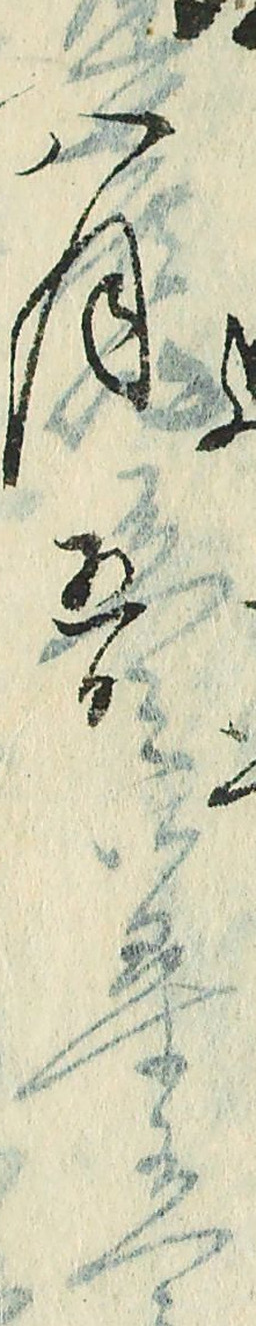八月五日
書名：公辺御役人為御廻浦御立越諸御用一巻
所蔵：鳴門教育大学 Naruto University of Education
